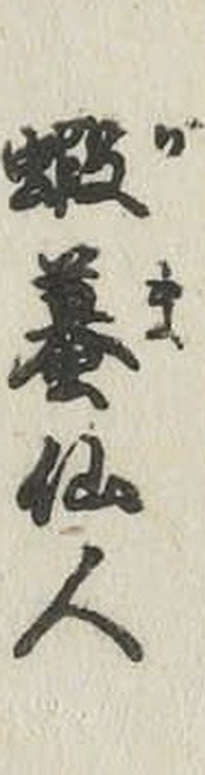蝦蟇仙人
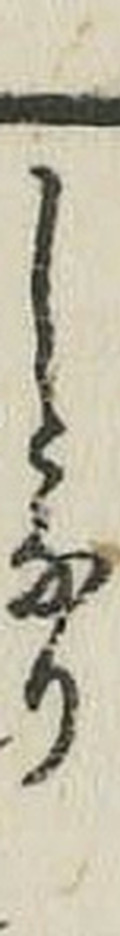しとなり
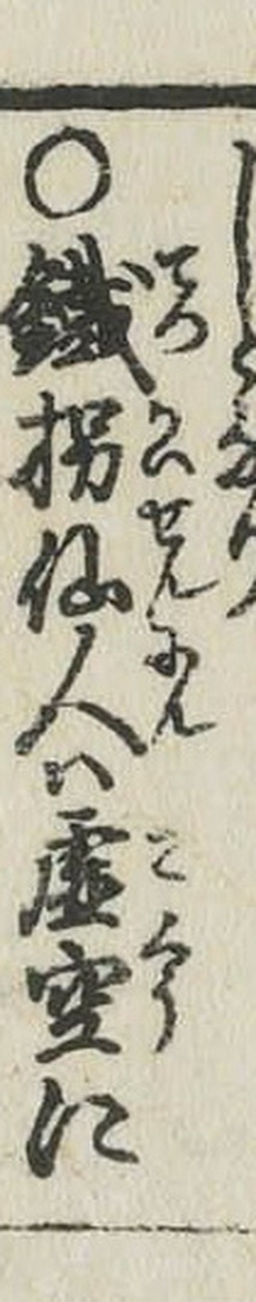○鉄拐仙人は虚空に
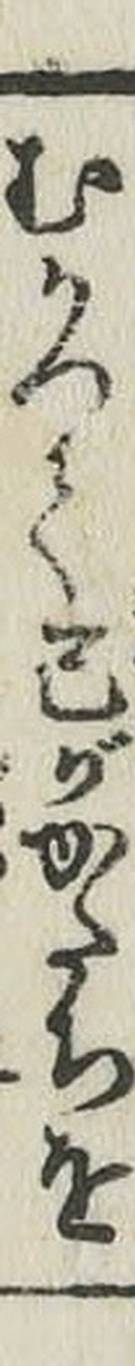むかつて己がかたちを
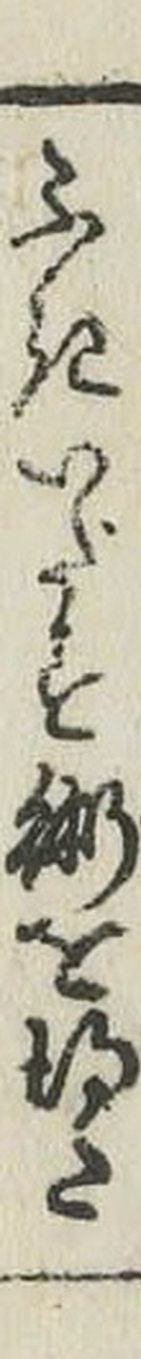ふきいだす術を得た
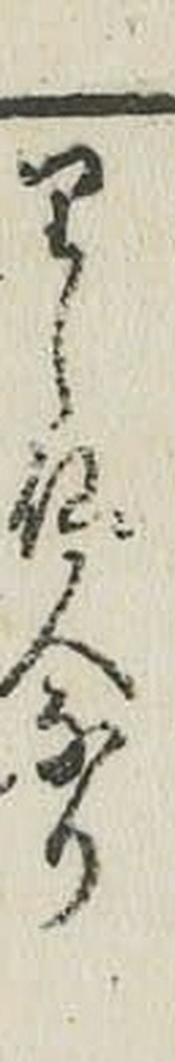りし仙人なり
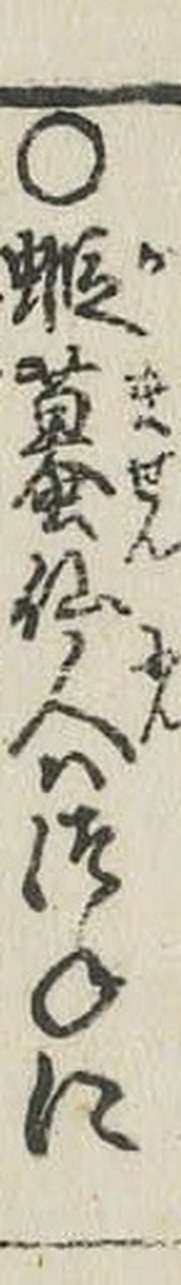○蝦蟇仙人はつねに
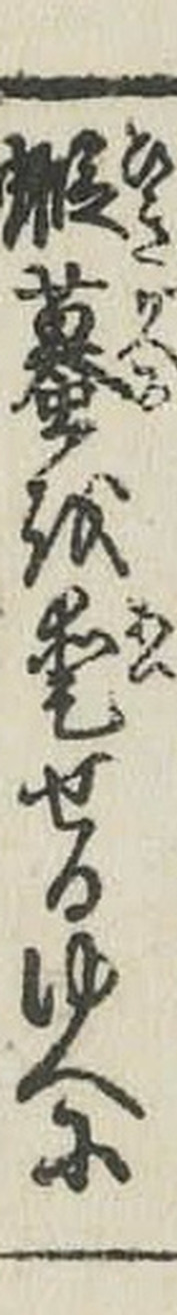蝦蟇を愛せるゆへに
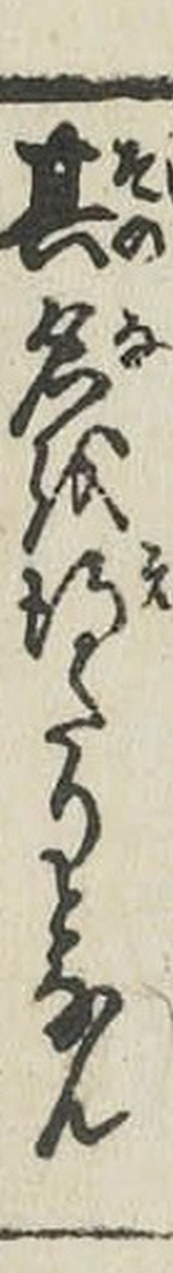其名を得たりとなん
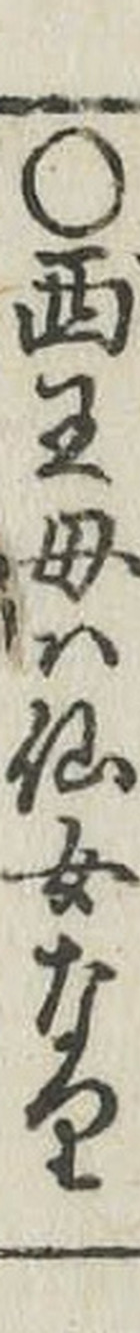○西王母は仙女なり
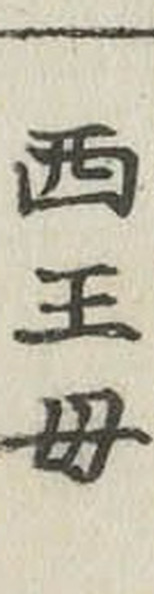西王母
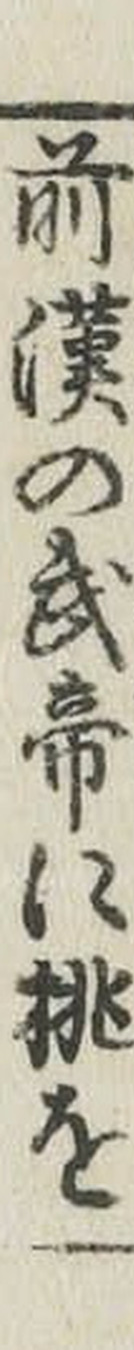前漢の武帝に桃を
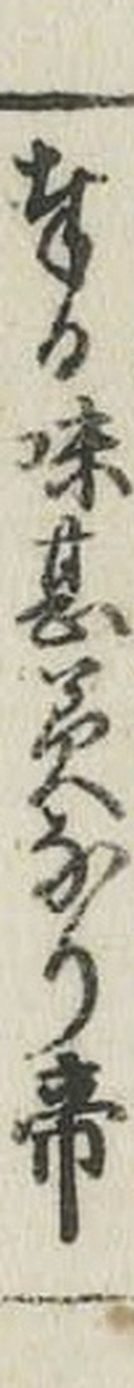奉る味甚美なり帝
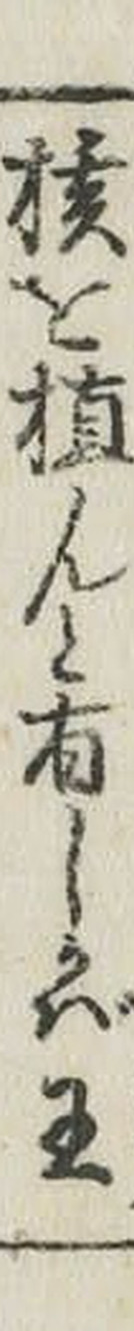核を植んと有しかば王
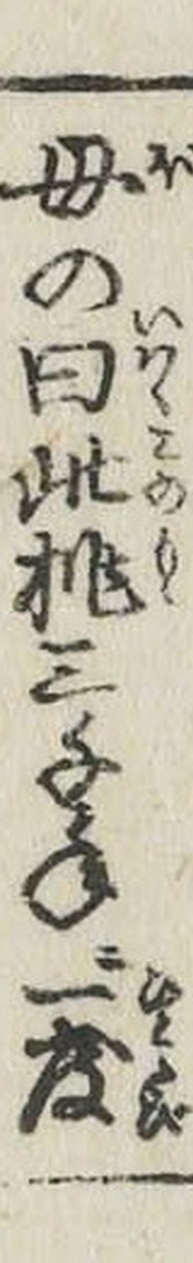母の曰此桃三千年一度
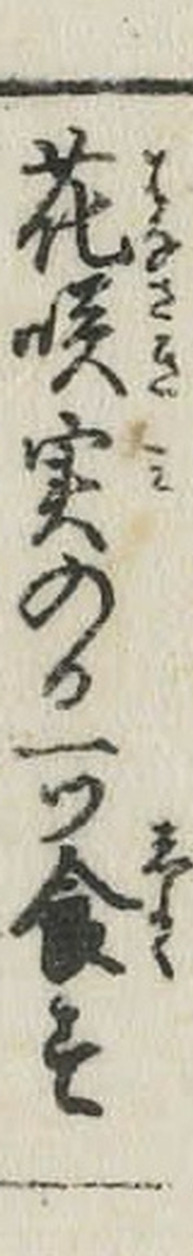花咲実のる一ツ食す
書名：増補頭書訓蒙図彙大成 10巻 10:巻之21
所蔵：東京学芸大学教育コンテンツアーカイブ
